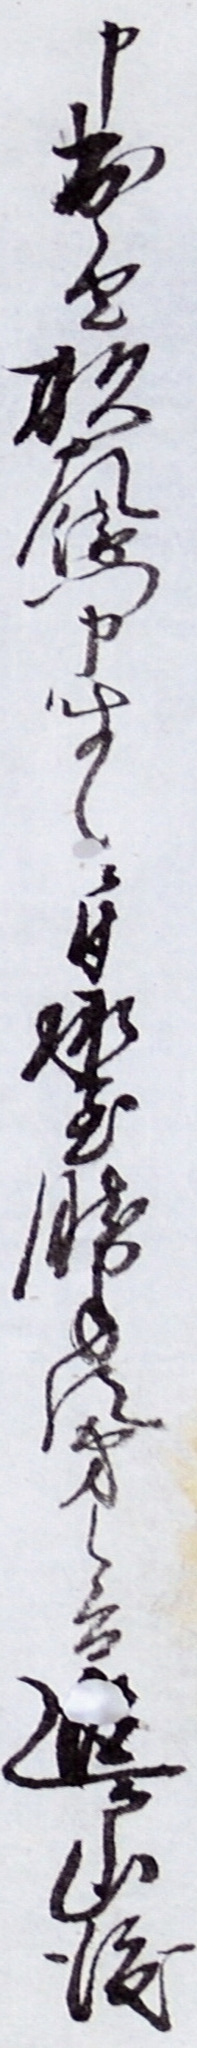申出候由杉左衛門申聞候ニ付承置勝手次第之旨は追々山渡
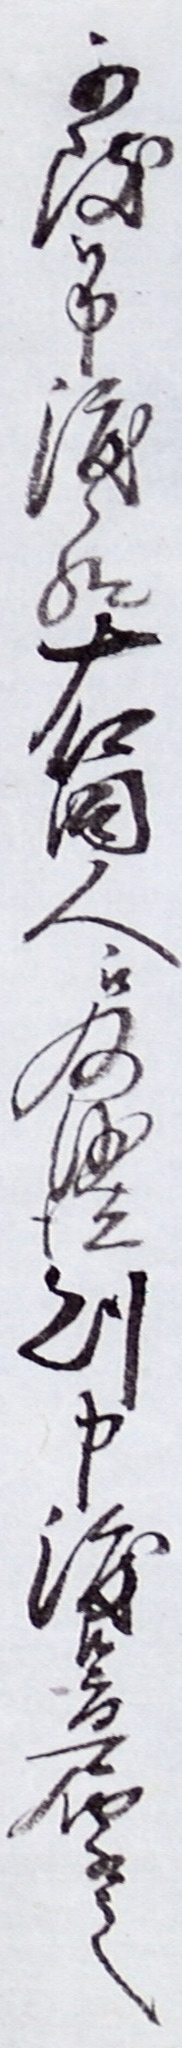可致可申渡候様右同人江及沙汰則申渡候旨届有之
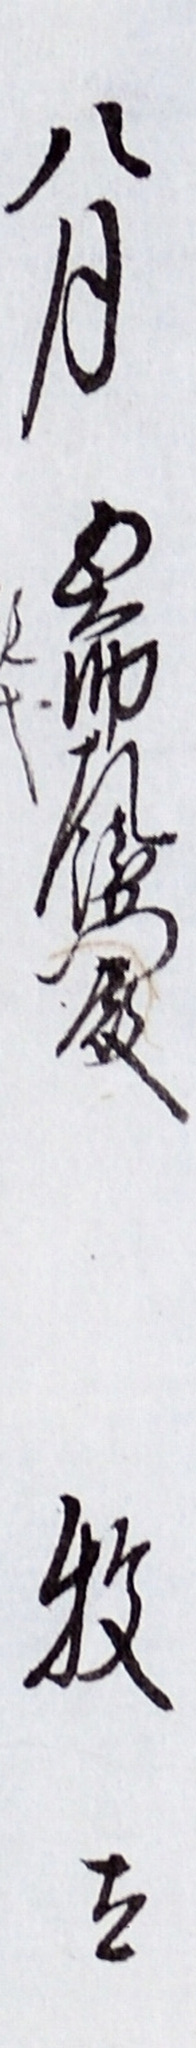八月五郎左衛門殿牧太
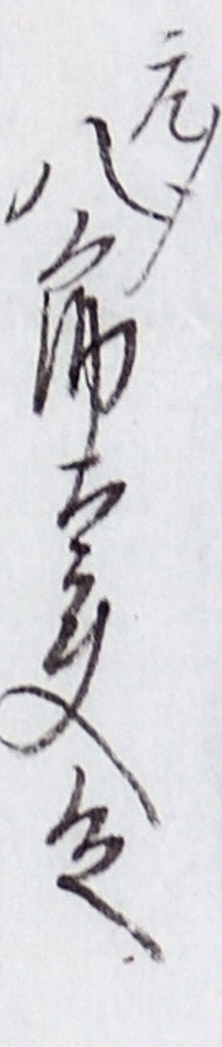八郎太夫殿
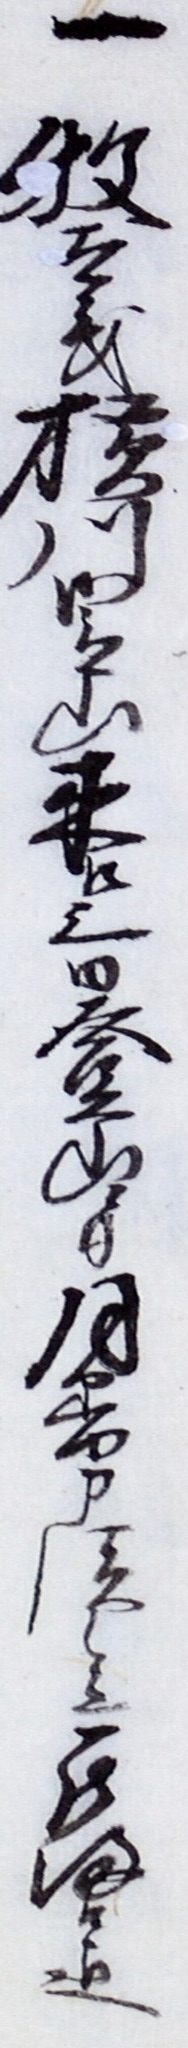一牧太義横川山来ル三日登山ニ付月番申談之上罷帰候迄
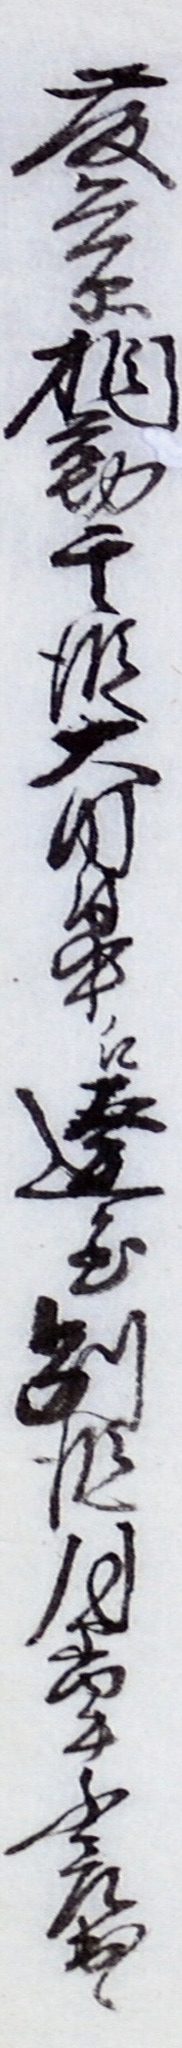藤兵衛相勤其段大目付中江達置別段月番中不差出候
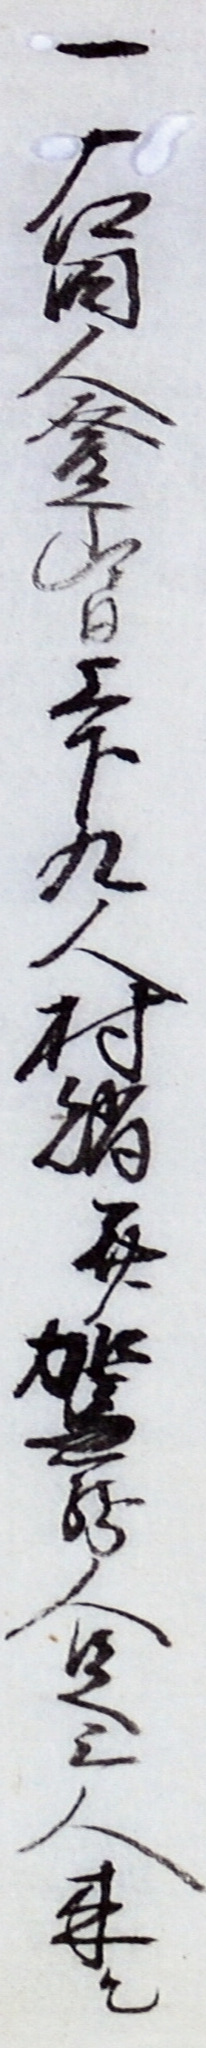一右同人登山ニ付上下九人村賄并加駕籠人足三人来ル
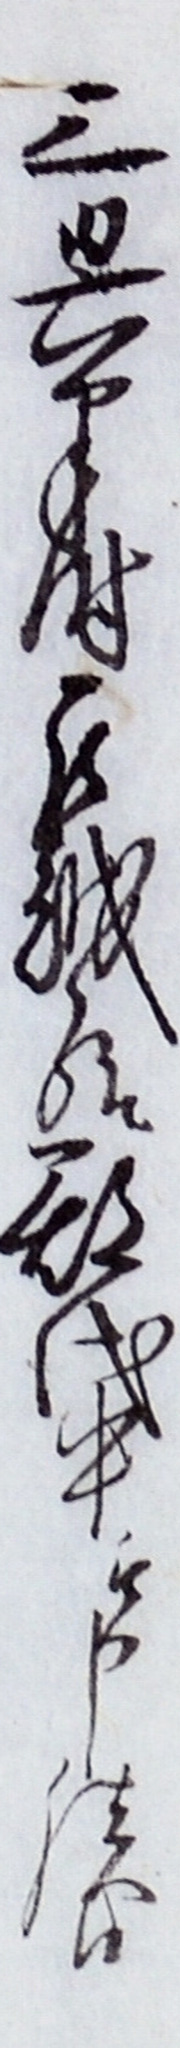三日六半時罷越候様郡代中被申談候
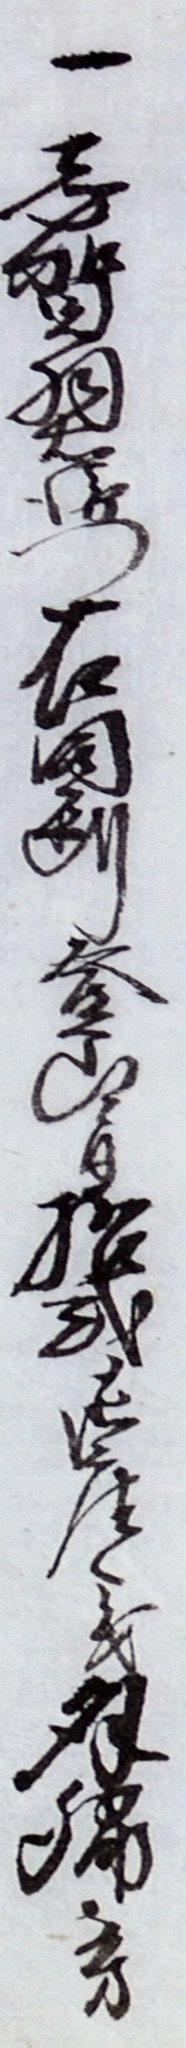一志賀羽右衛門右同断登山ニ付拾弐御座之義外郷之方
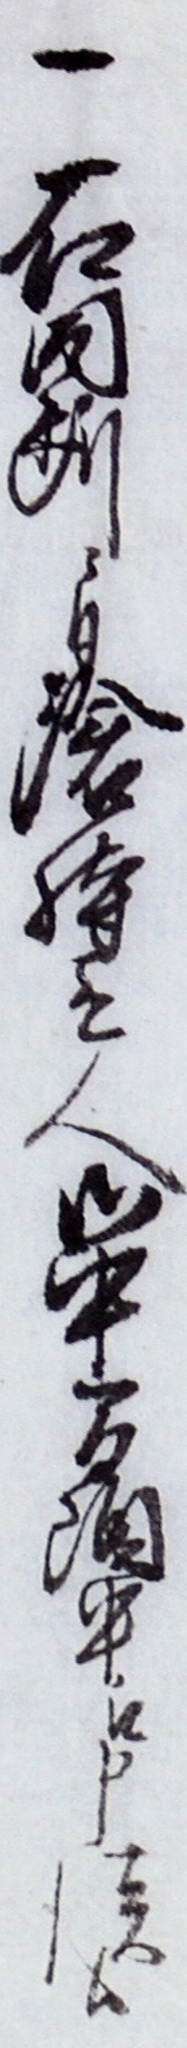一右同断ニ付鎗持壱人山中方調中江申談候
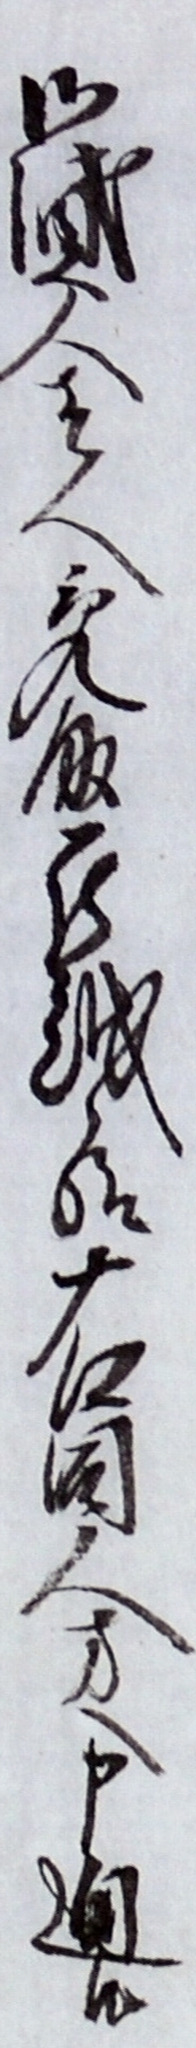御貸人壱人受取罷越候様右同人方へ申通候
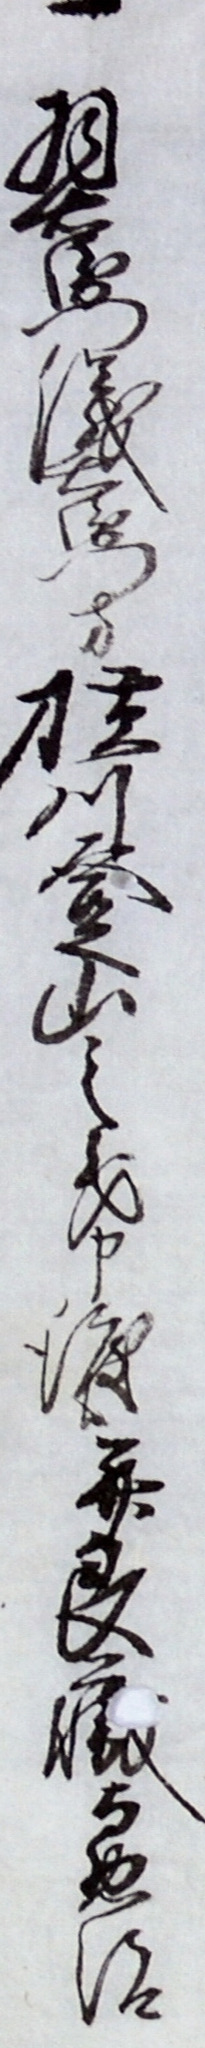一羽右衛門儀右衛門方横川登山之義申渡候并良蔵与惣治
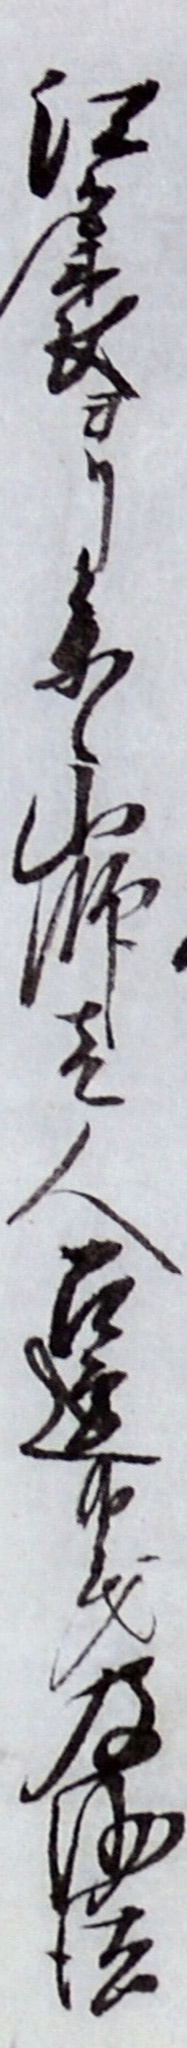江戸表ヨリ参候山師壱人召連候義及沙汰
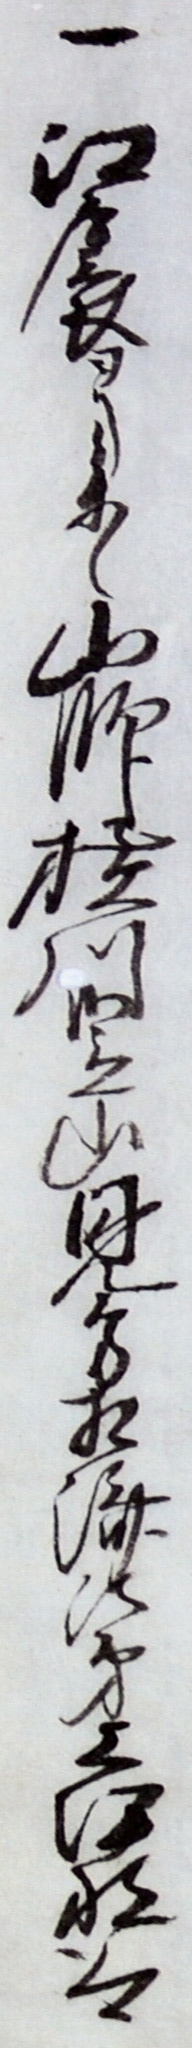一江戸表ヨリ参候山師横川御立山見方相済次第上伊那郷

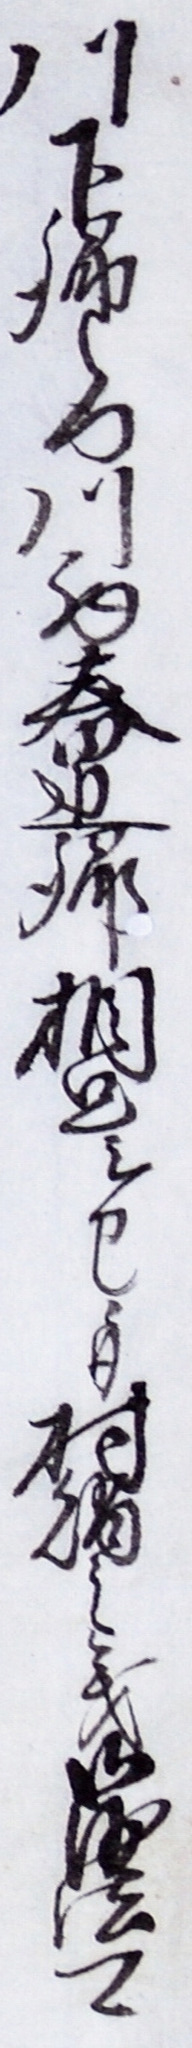川下郷之内川西春近郷相廻シ申候ニ付村触之義御沙汰可
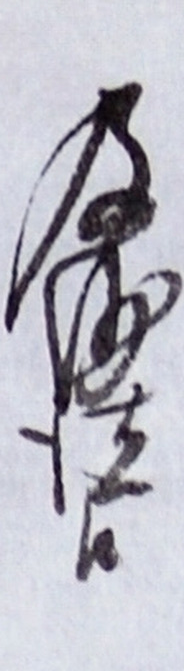及沙汰候
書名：御山奉行御用控
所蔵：伊那市立高遠町図書館・合同会社AMANE
